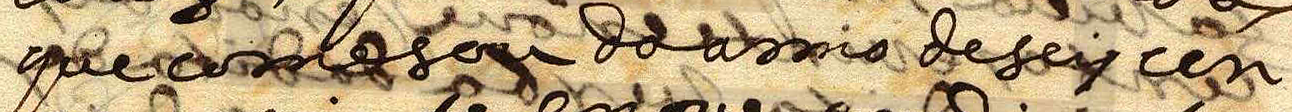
que comesou do anno de seiscen
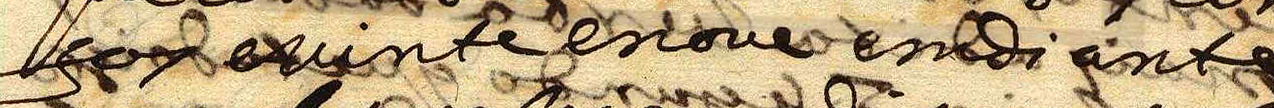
tos e vinte e noue em diante
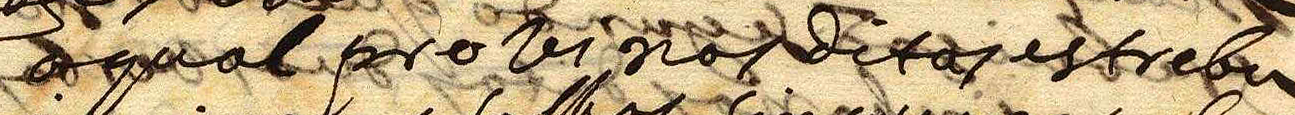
o qual provi nas ditas estrebu
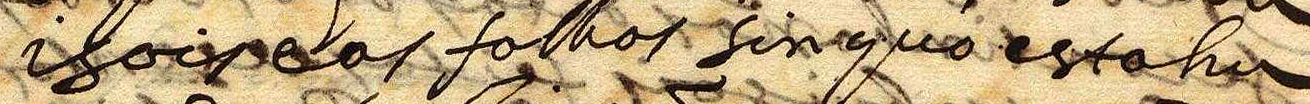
isois e as folhas sinquo esta hu
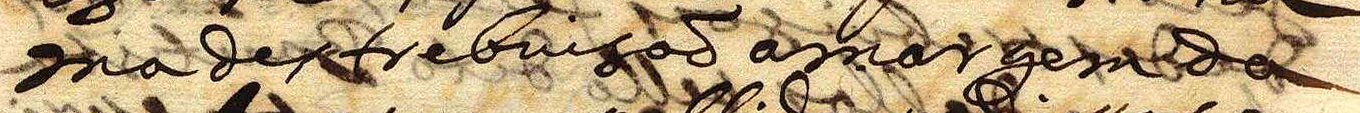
ma destrebuisaõ a margem da
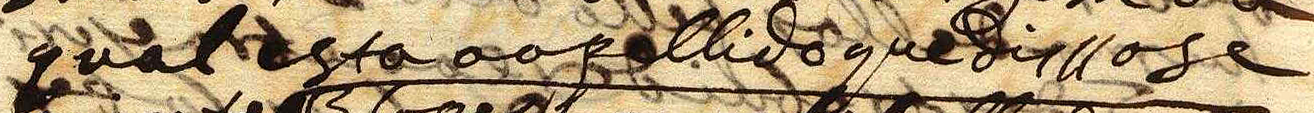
qual esta o apellido que dis // o se
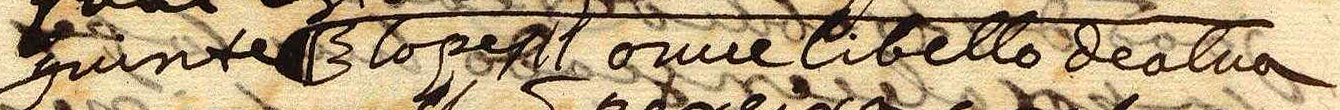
guinte ⁋ lopes // ouue libello de alua
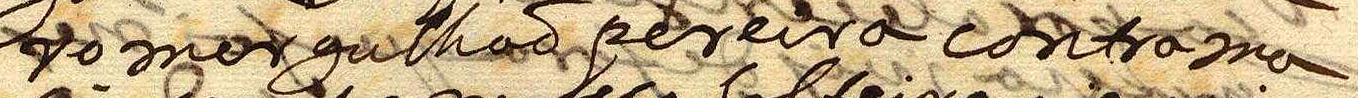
ro mergulhaõ pereira contra ma
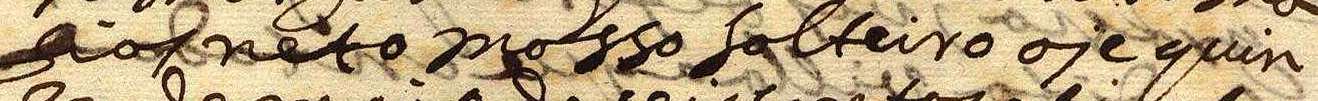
tias neto mosso solteiro oje quin
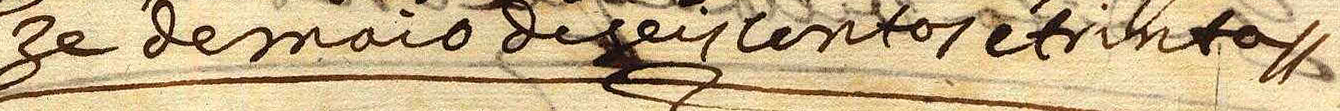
ze de maio de seiscentos e trinta //
